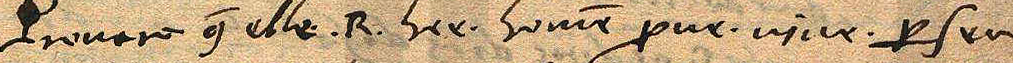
Prouara q̄ elle .R. hee. homē ꝓue. uiue. ꝑ seu
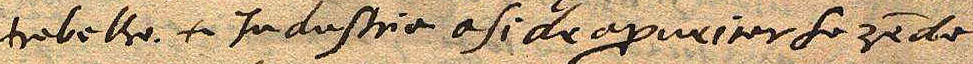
trabalho. e Jndustria asi de aꝓueitar fazēda
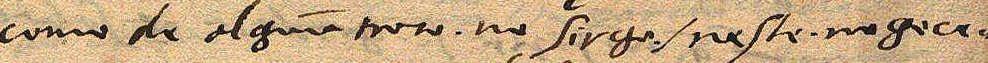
como de alguū trato. no sirgo ./ neste. negoceo
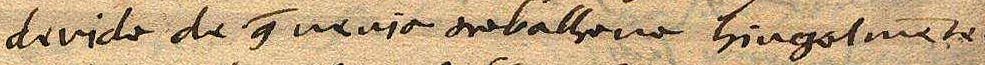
de uida de q̄ ueuia trabalhaua hingalmēte.
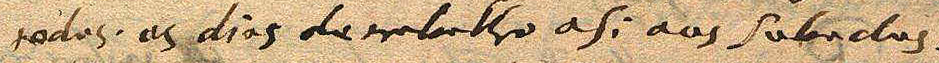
todos . os dias de trabalho asi aos sabados.
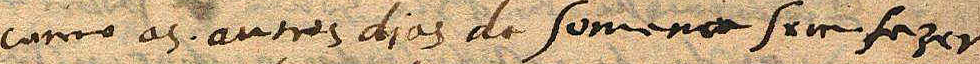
como os . outros djas da somana sem fazer
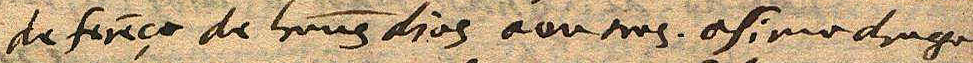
deferēça de huūs dias a outros. asi madruga
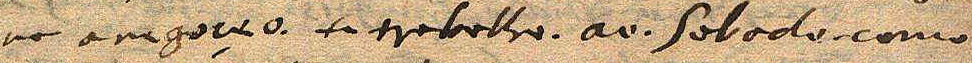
ua o negoçeo. e trabalho .ao. sabado. como
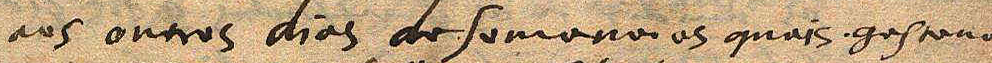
aos outros dias da somana os quais. gastaua
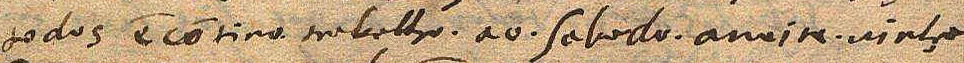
todos ē cōtino trabalho. ao . sabado. a noite. uinha
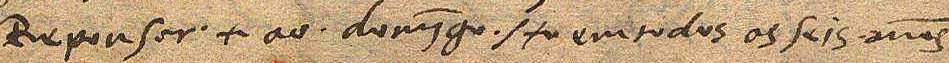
Repousar. e ao . domj̄go ./ e em todos os seis an̄os
